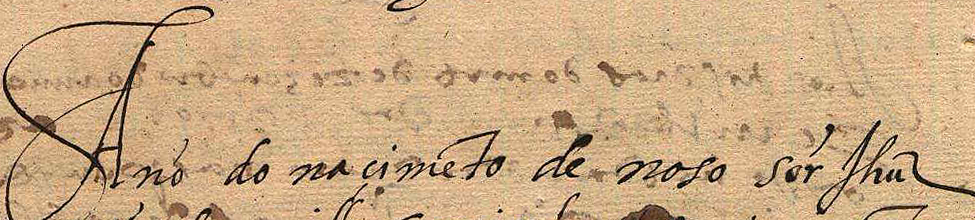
Anō do naçimēto de noso sor̄ Jhū
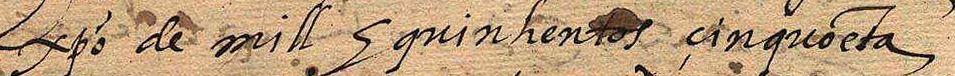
Xpō de mill E quinhentos çinquoēta
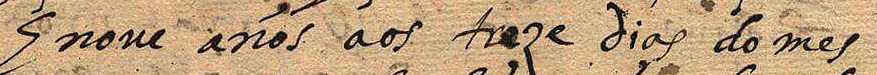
E noue anōs aos treze dias do mes
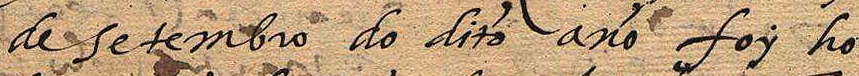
de setembro do dito anō foy ho
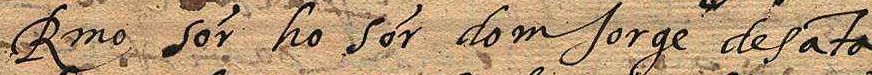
Rmo sor̄ ho sor̄ dom Jorge de sāta
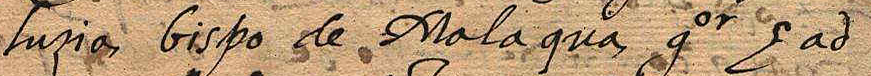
luzia bispo de Malaqua gor E ad
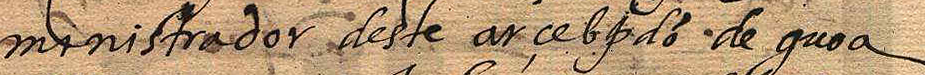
ministrador deste arçebpdō de guoa
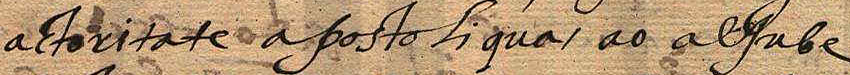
actoritate apostoliqua / ao alJube
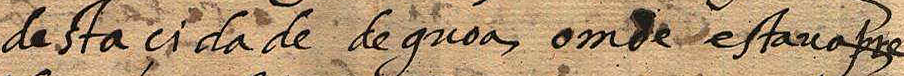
desta çidade de guoa omde estaua pre
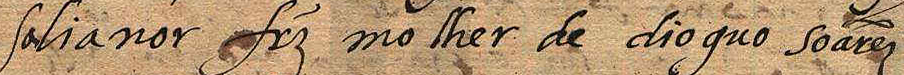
sa lianor frz̄ molher de dioguo soarez
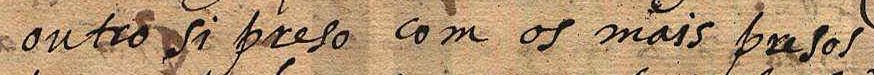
outrosi preso com os mais presos
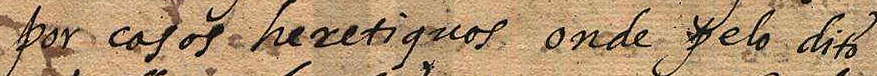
por casos heretiquos onde pelo ditō
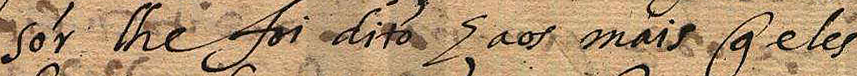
sor̄ lhe foi ditō E aos mais q̄ eles
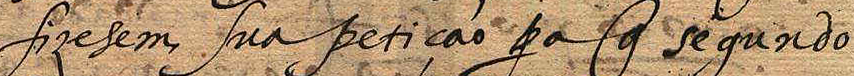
fizesem sua petição ꝑa q̄ segundo
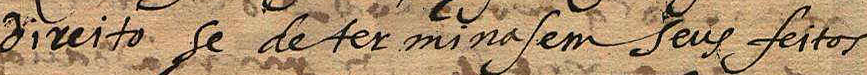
direito se determinasem seus feitos
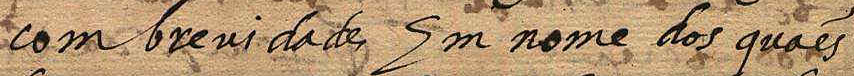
com breuidade Em nome dos quaes
